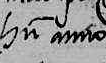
hū anno
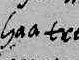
haa tres
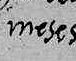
meses.
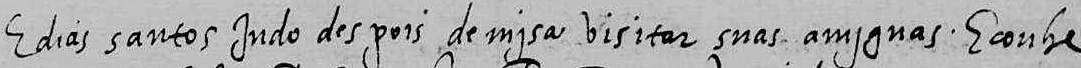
E dias santos Jndo despois de mjsa visitar suas amjguas. E conhe
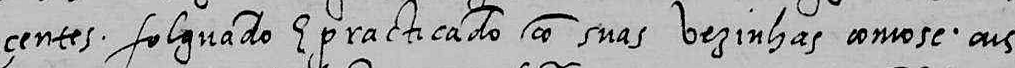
centes. folguādo E practicādo c̄o suas vezinhas como se cus
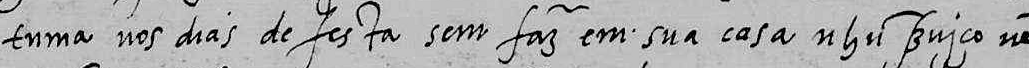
tuma nos dias de festa sem faz̄ em sua casa nhū ꞩujço nē
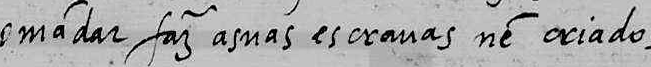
o mādar faz̄ a suas escrauas nē criados
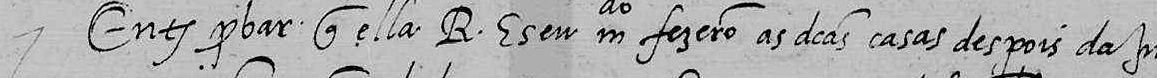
7 Entꝭ ꝓvar q̄ ella R. E seu mdo fezerō as dcas̄ casas despois da Jn
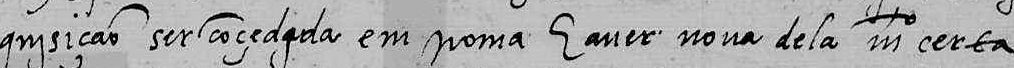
qujsiçaõ ser c̄ocedjda em rroma E auer noua dela mto certa
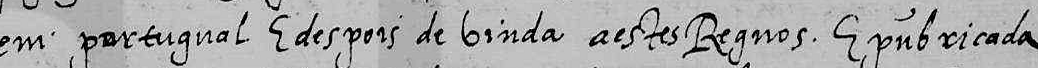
em portugual E despois de vinda a estes Regnos. E pubricada
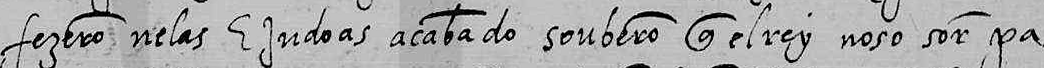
fezerō nelas E Jndo as acabādo souberō q̄ el rey noso sor̄ pa
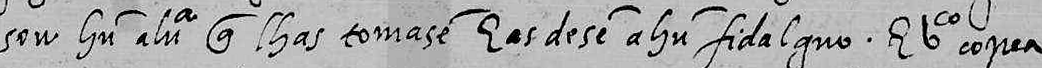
sou hū alua q̄ lhas tomasē E as desē a hū fidalguo . E vco correa
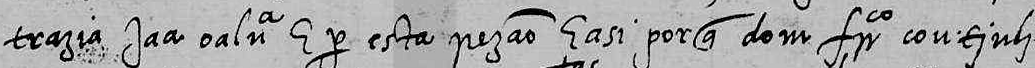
trazia Jaa o alua E ꝑ esta rrezão E asi porq̄ dom frrco coutjnho
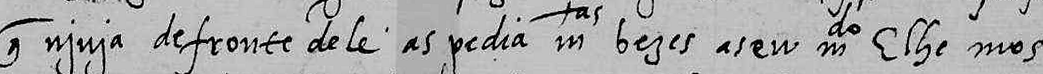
q̄ ujuja defronte dele as pedia mtas vezes a seu mdo E lhe mos
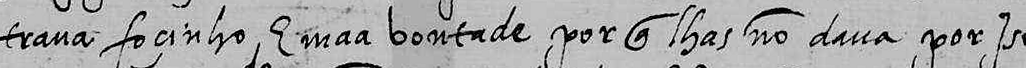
traua focinho E maa vontade porq̄ lhas n̄o daua por Jso
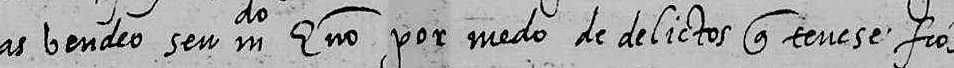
as vendeo seu mdo E n̄o por medo de delictos q̄ teuese fcos̄
